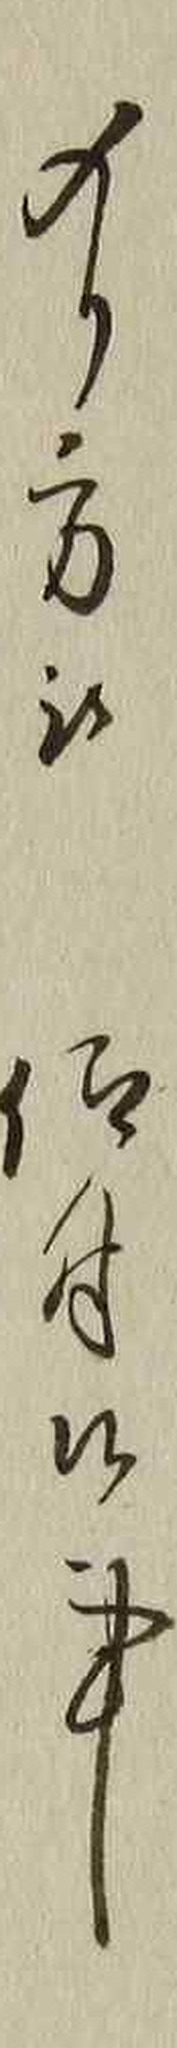〆り方被仰付候事
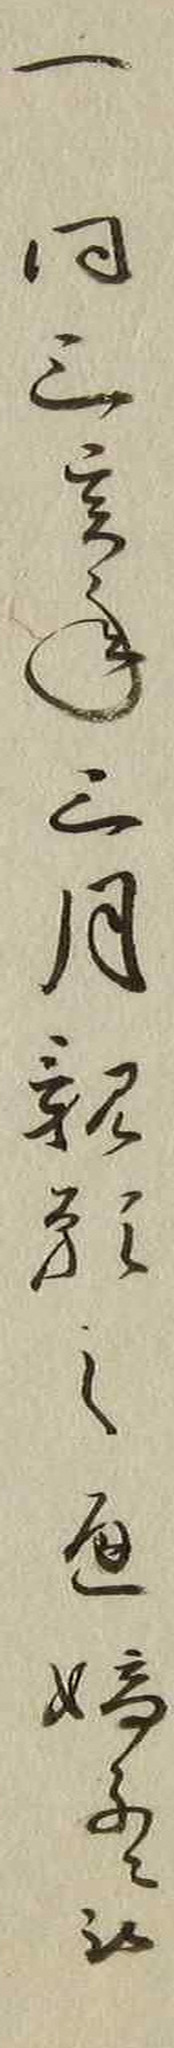一同三亥年三月親願之通嫡子に被
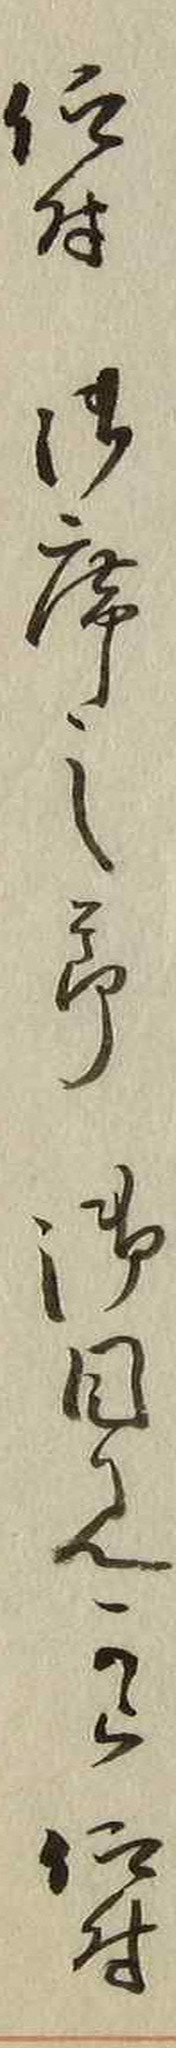仰付御席之節御目見可被仰付
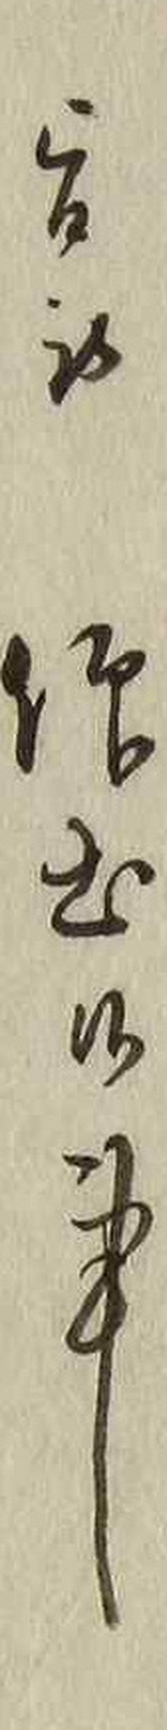旨被仰出候事
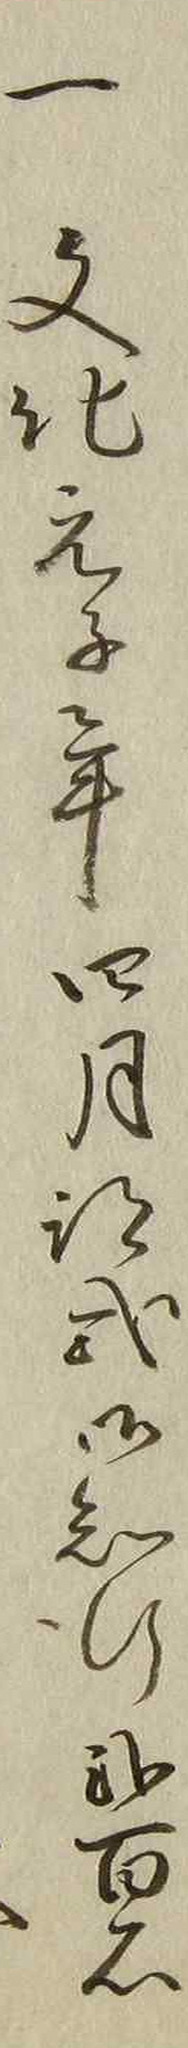一文化元子年四月跡式御知行弐百石
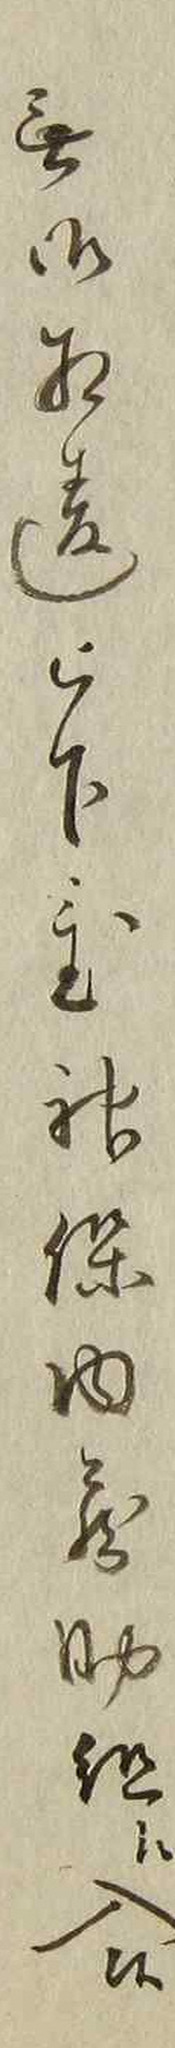無御相違被下置神保内蔵助組江入候
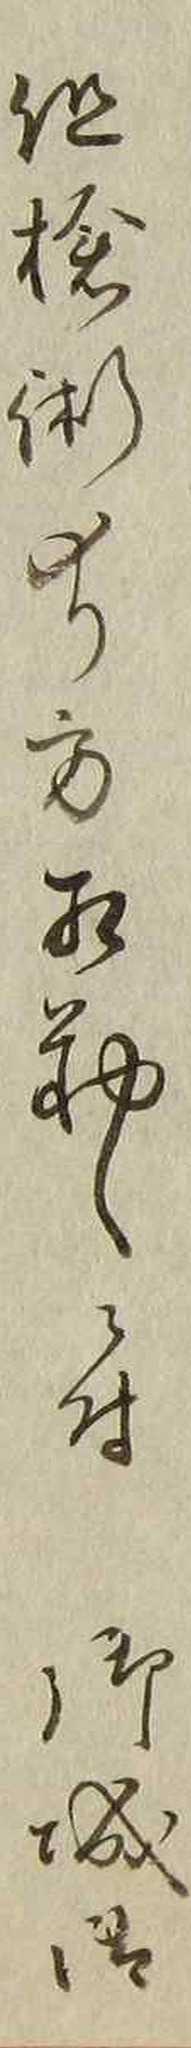但槍術〆り方相勤候に付御城御
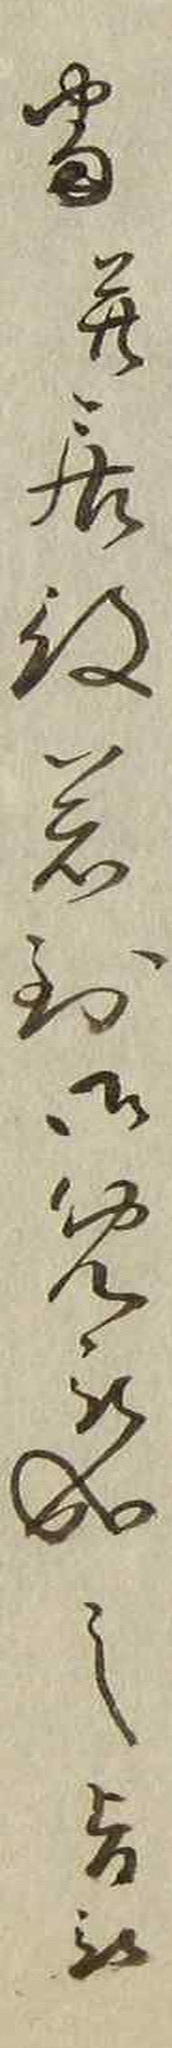番并居役着到御免被成之旨被
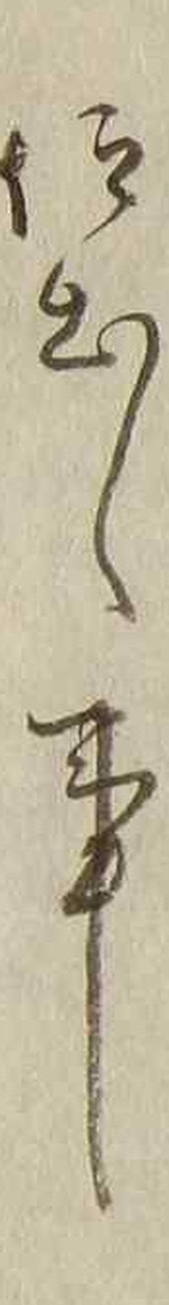仰出候事

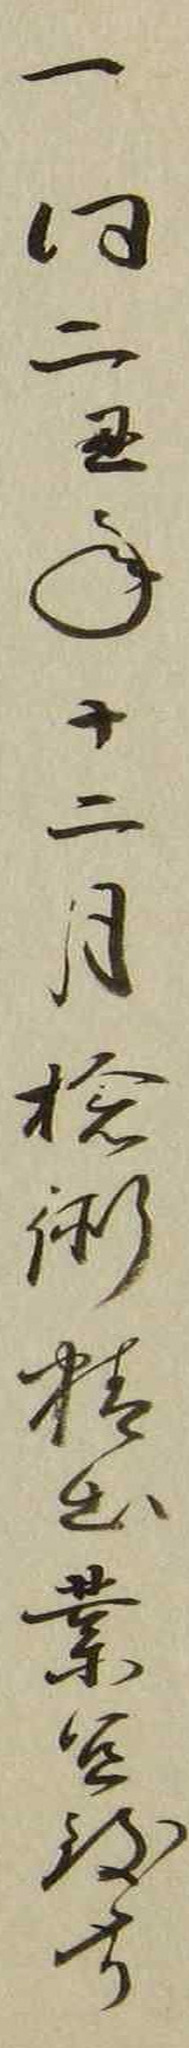一同二丑年十二月槍術精出業宜致〆り
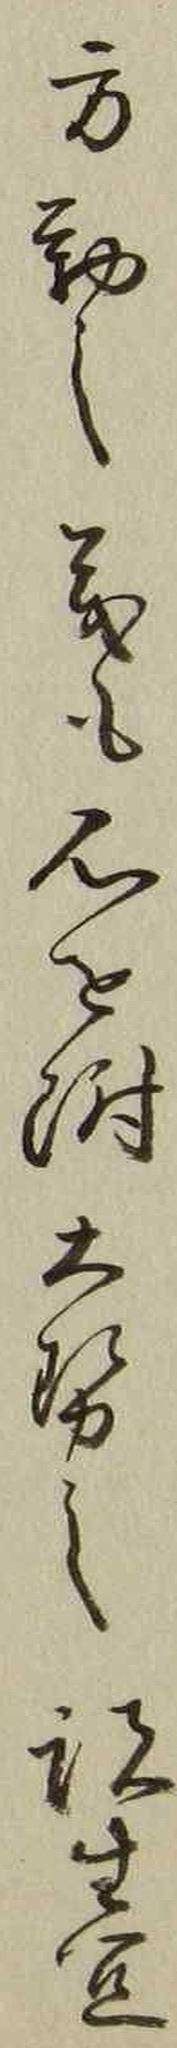方勤之義も心を附大勢之諸生宜
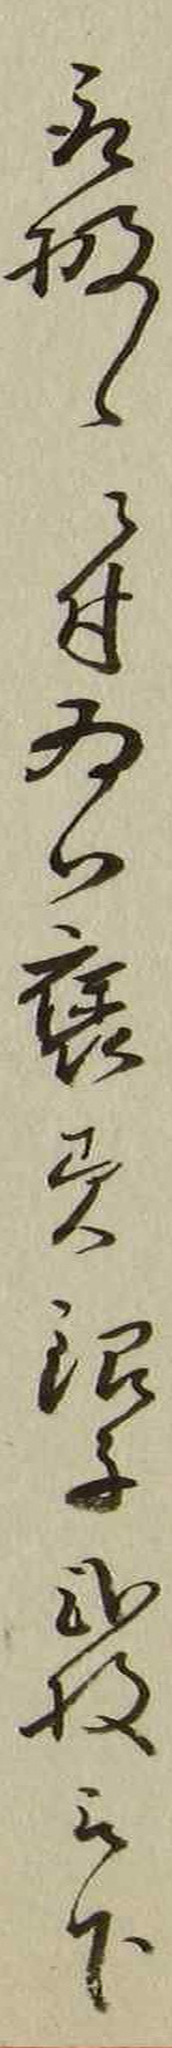取扱候に付為御褒美銀子弐枚被下
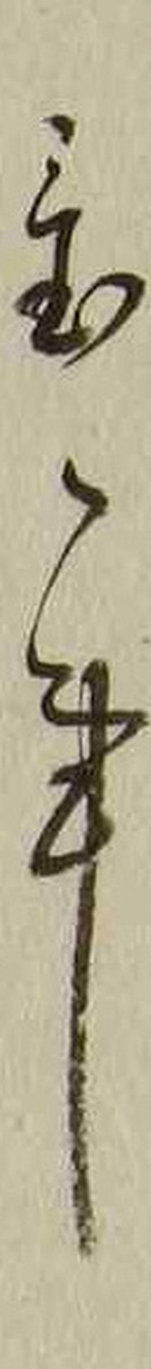置候事
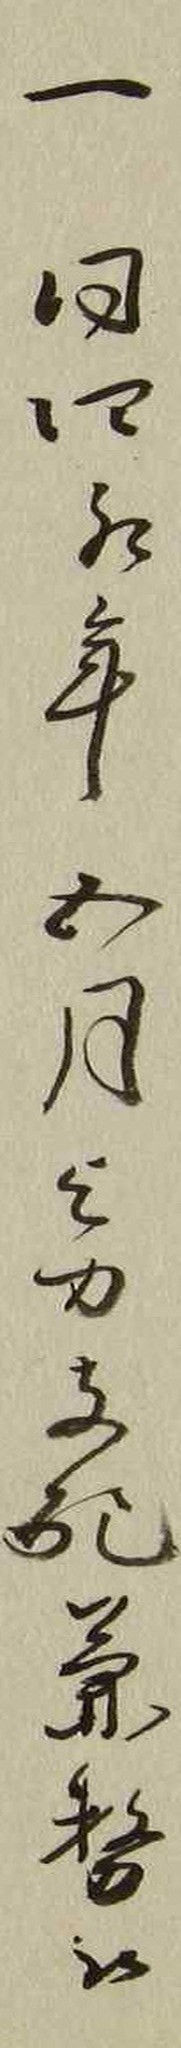一同四卯年五月与力支配兼務被
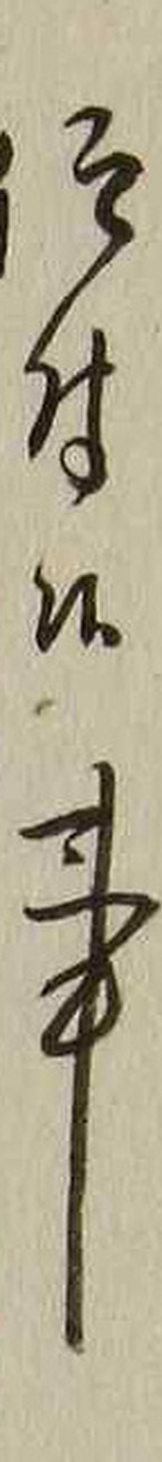仰付候事
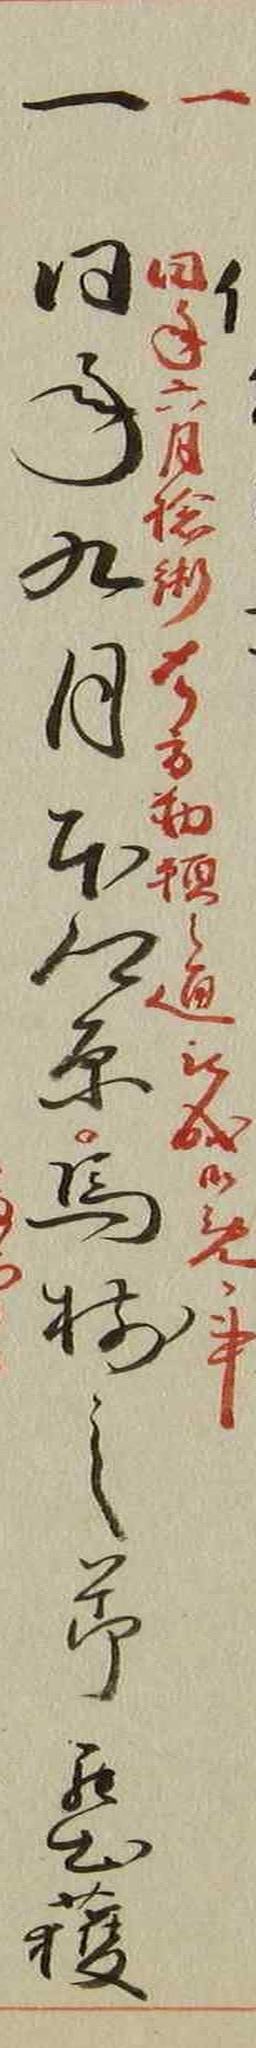一同年九月本郷原◦馬揃之節罷出獲
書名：諸士系譜　巻之3　い之部3
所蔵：会津若松市立会津図書館
